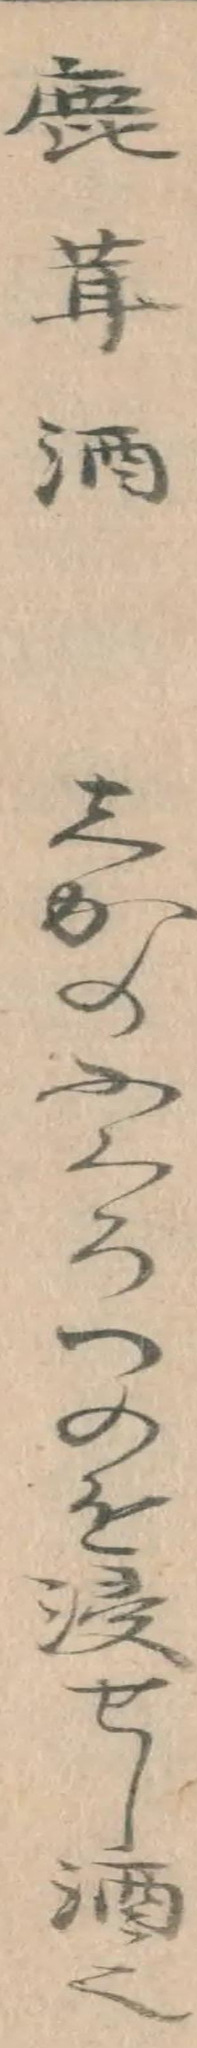鹿茸酒しかのふくろつのを浸せし酒也
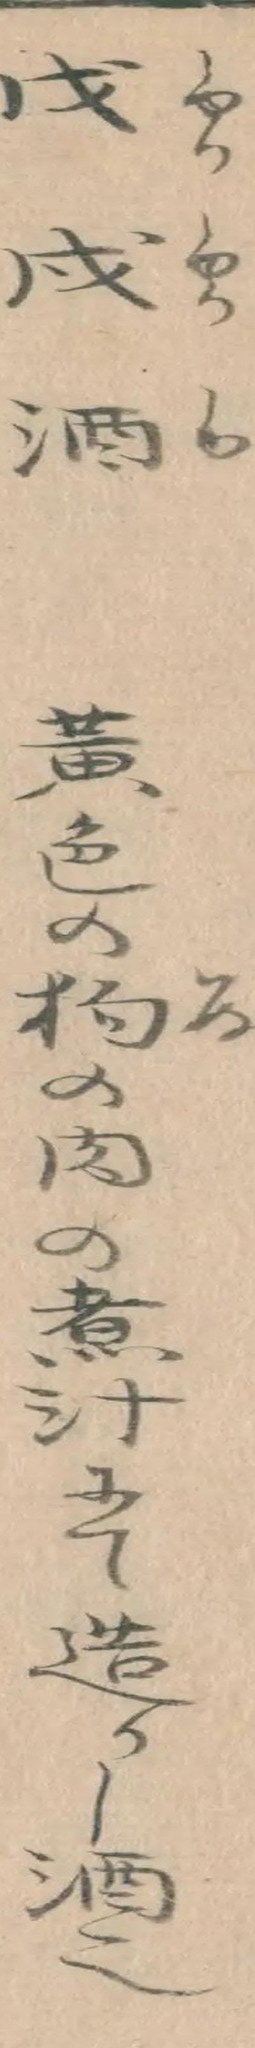戊戌酒黄色の狗の肉の煮汁にて造りし酒也

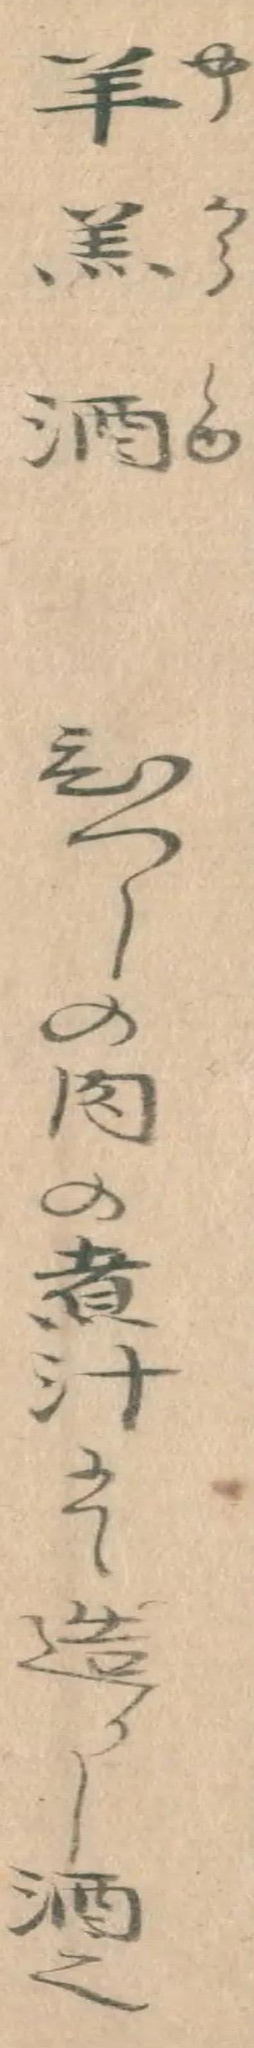羊羔酒ひつしの肉の煮汁にて造りし酒也
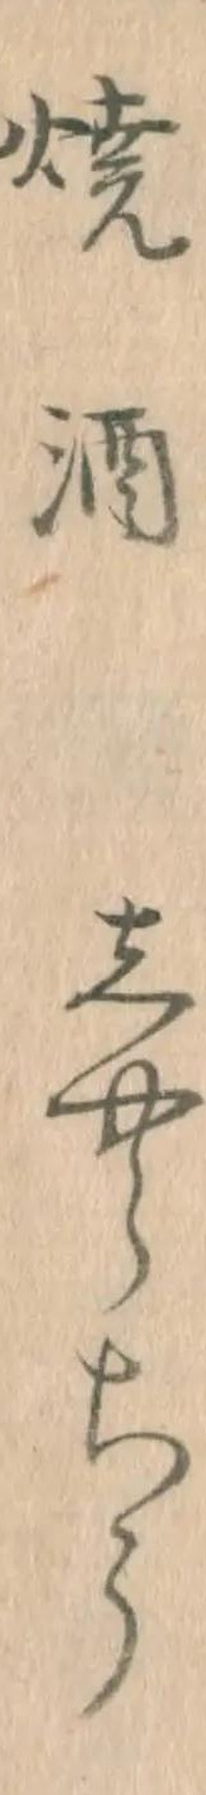焼酒しやうちう
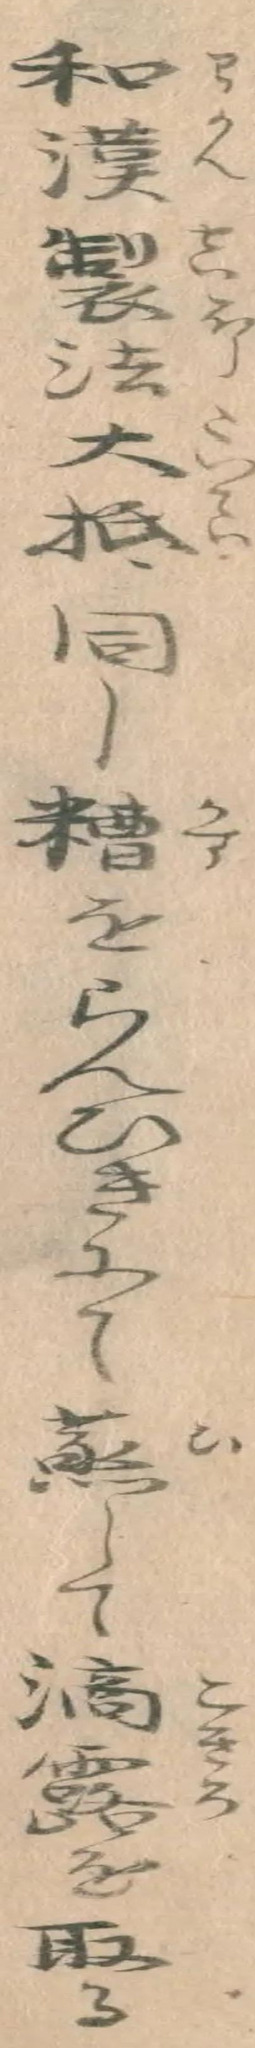和漢製法大抵同し糟をらんひきにて蒸して滴露を取る
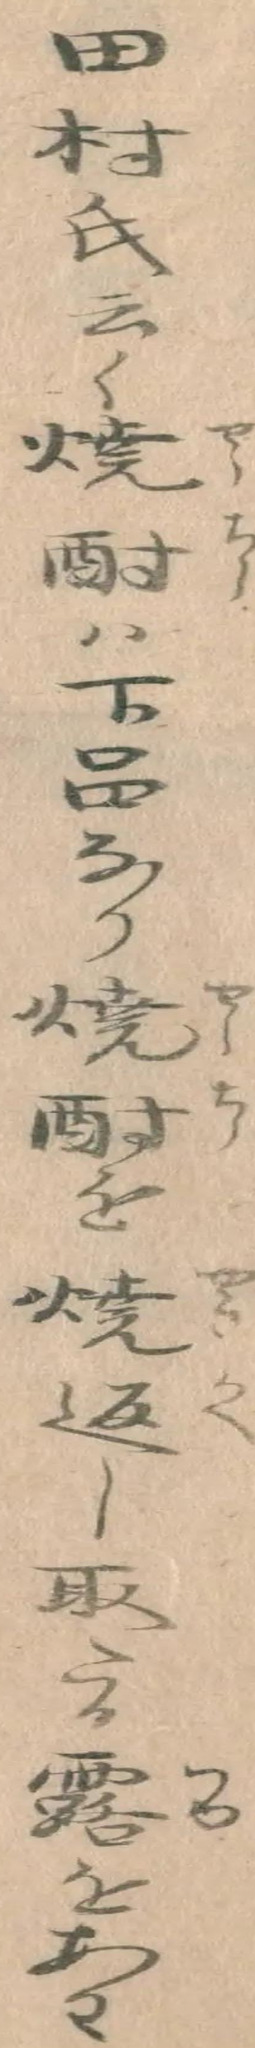田村氏云く焼酎は下品なり焼酎を焼返し取たる露をあわ
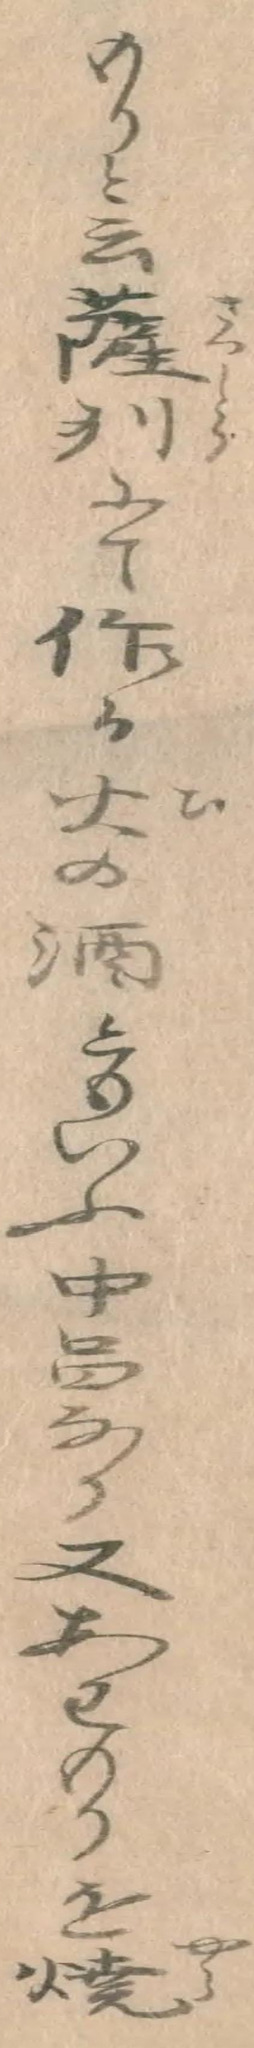もりと云薩州にて作る火の酒ともいふ中品なり又あわもりを焼
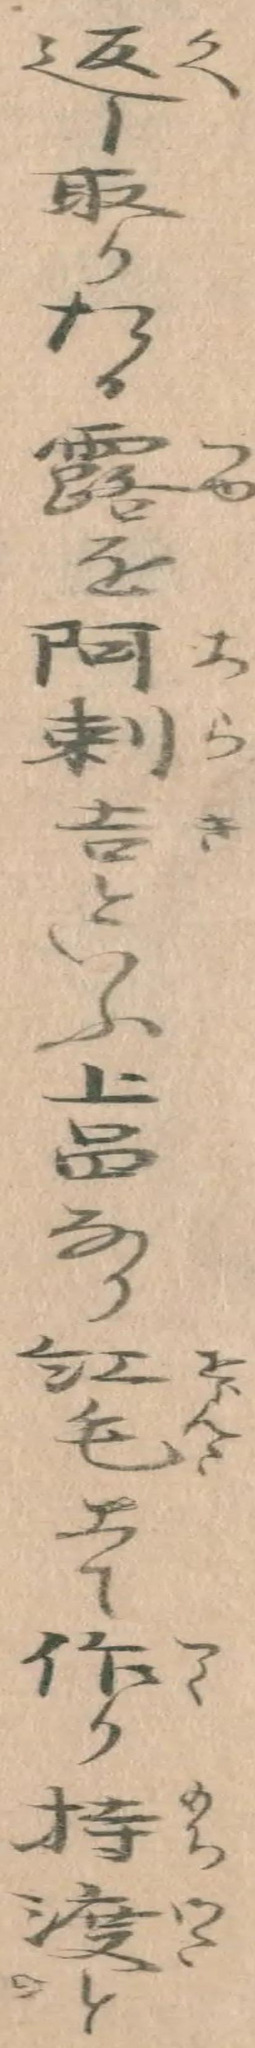返し取りたる露を阿剌吉といふ上品なり紅毛にて作り持渡と
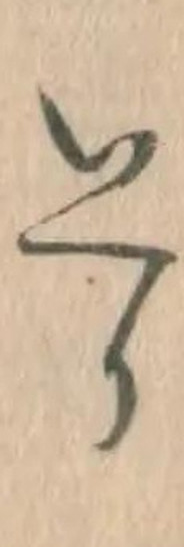いへり
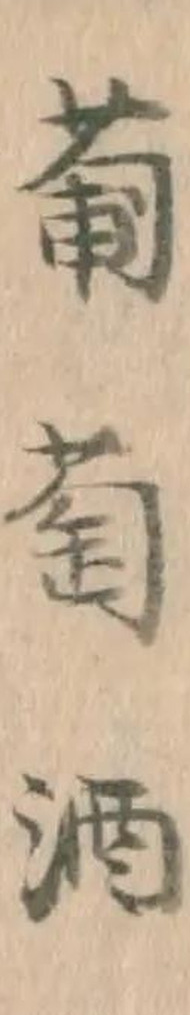葡萄酒
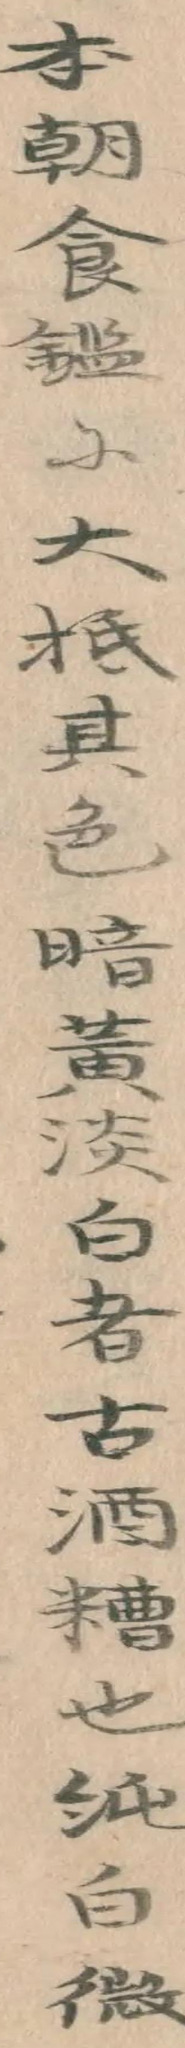本朝食鑑に大抵其色暗黄淡白者古酒糟也純白微
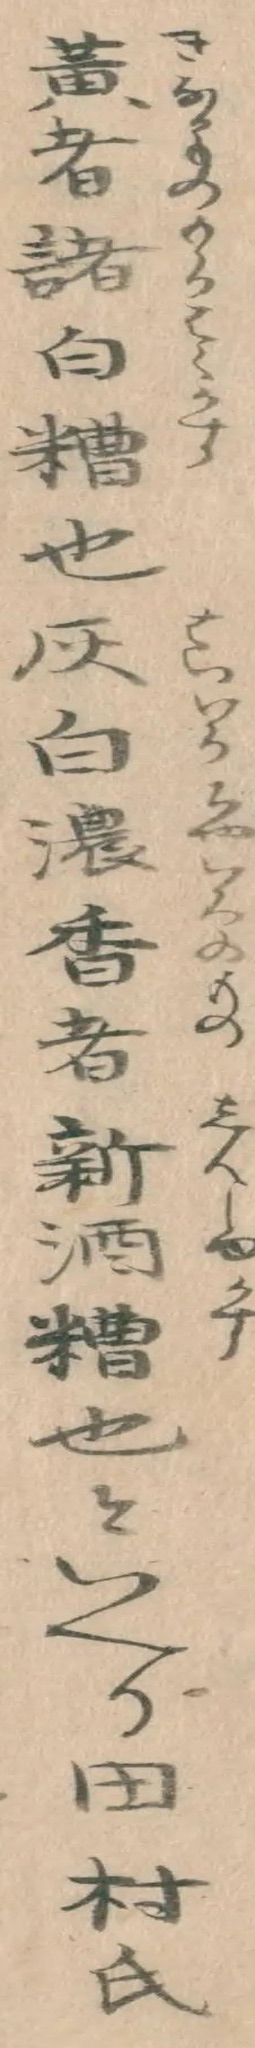黄者諸白糟也灰白濃香者新酒糟也といへり田村氏
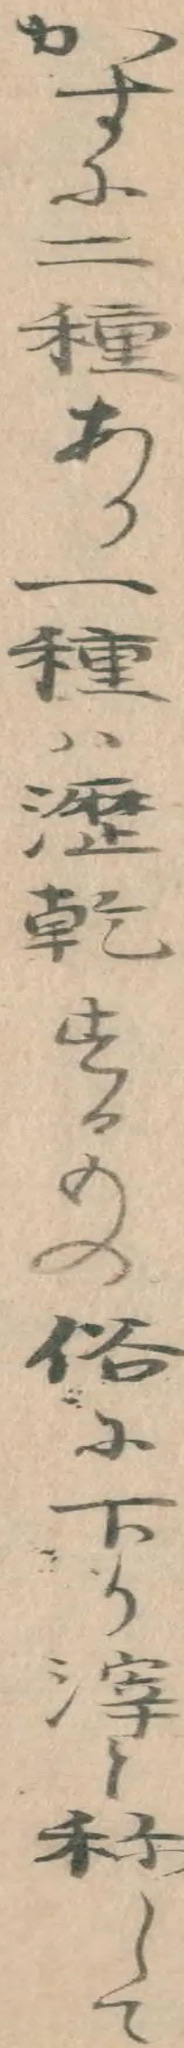かすに二種あり一種は瀝乾するもの俗に下り滓と称して

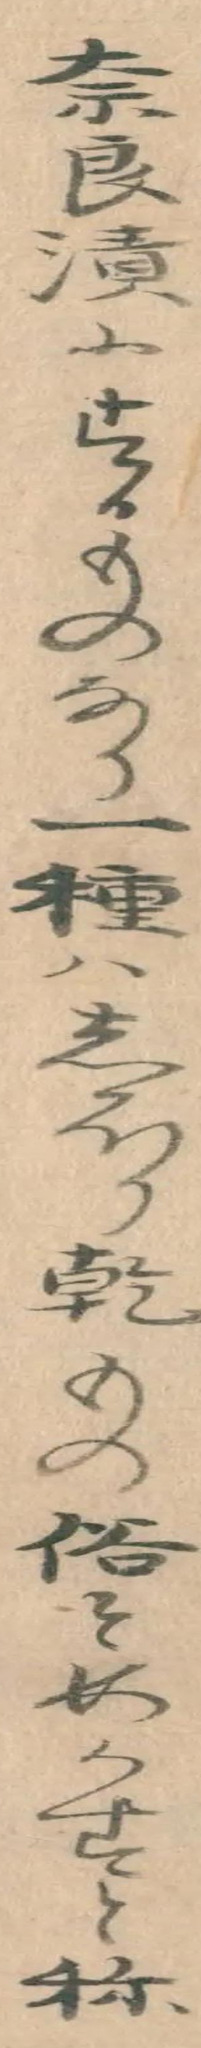奈良漬にするものなり一種はしほり乾もの俗とめかすと称
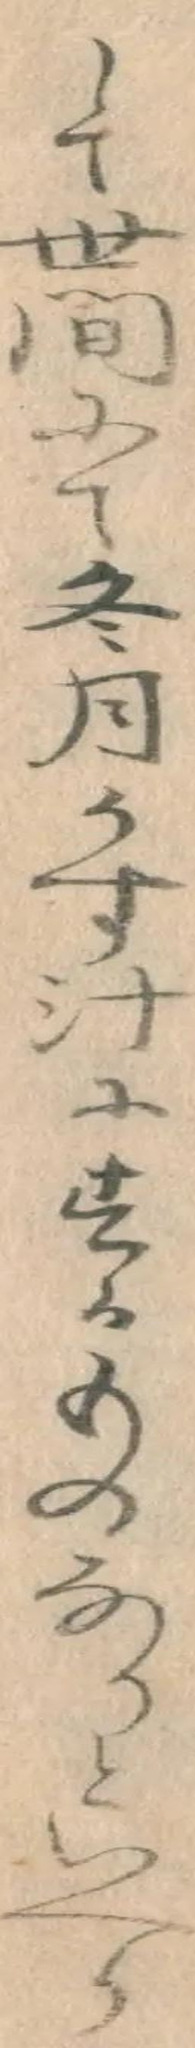して世間にて冬月かす汁にするものなりといへり
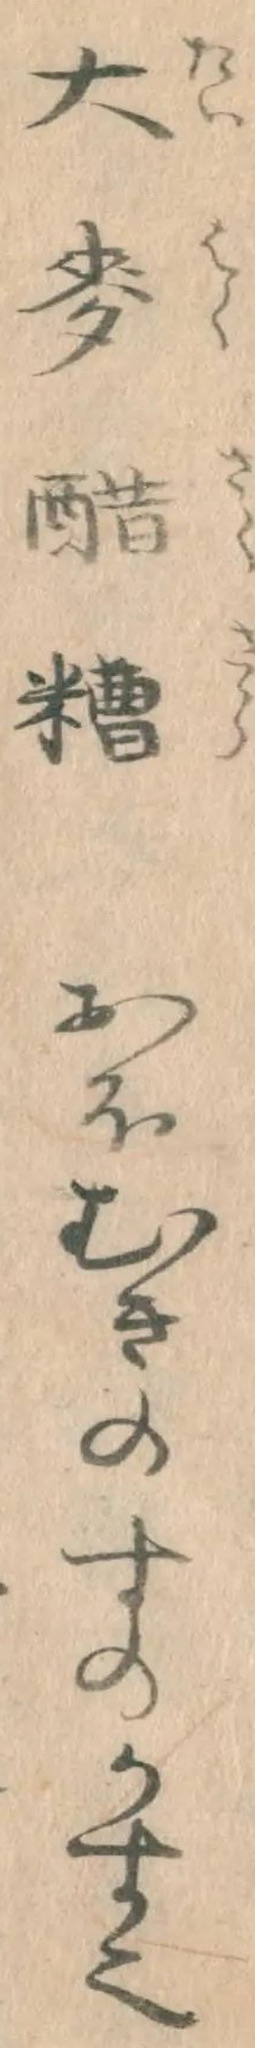大麦醋糟おほむきのすのかす也
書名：本草図譜. 巻43-45
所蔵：国立国会図書館 National Diet Library, JAPAN
